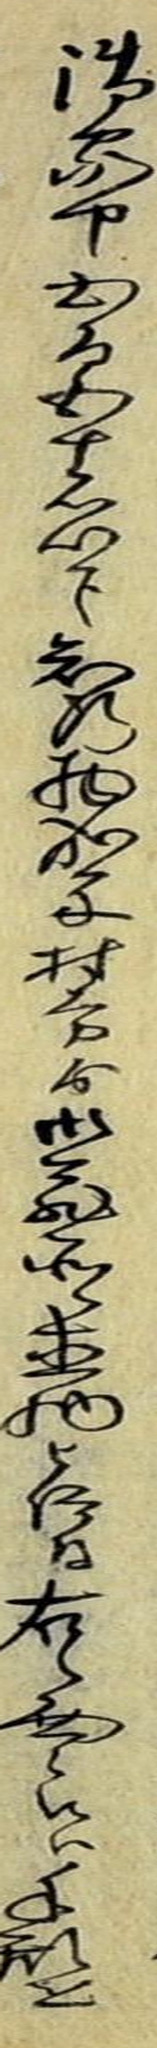御家中五百五十石以下知行物成米村方ゟ御蔵所へ直納被仰付右之面々江は手形を
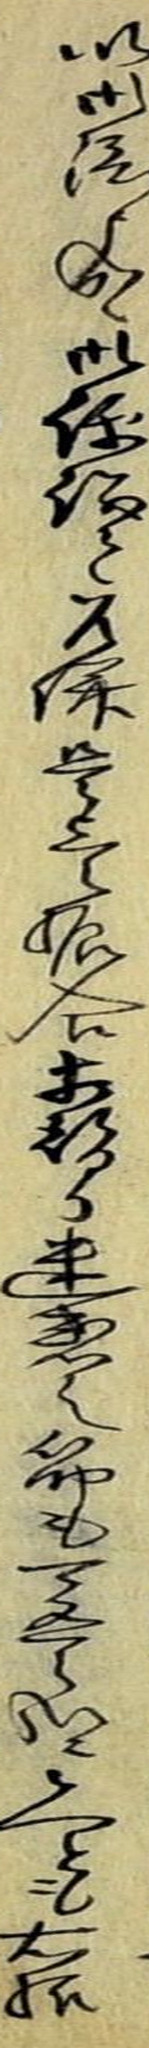以御渡被成候御評議に候乍併是迄之振合相替り迷惑之筋も可有之哉に候へとも右様
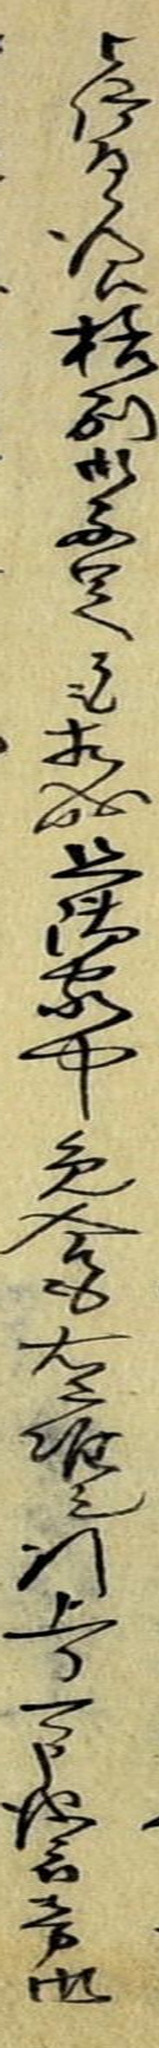被仰付候得は格別御不足にも相成且御家中免合も右に准し引上り可申儀二付旁御
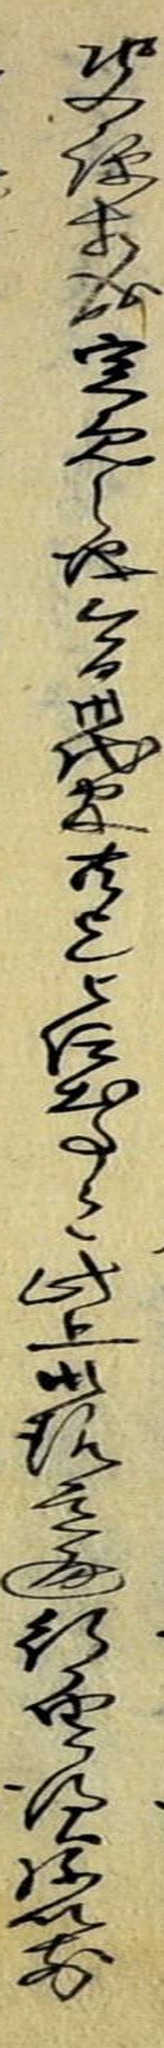決評相成定免之儀今日御代官共迄被仰出事に候此上御趣意通行届候得は弥以前
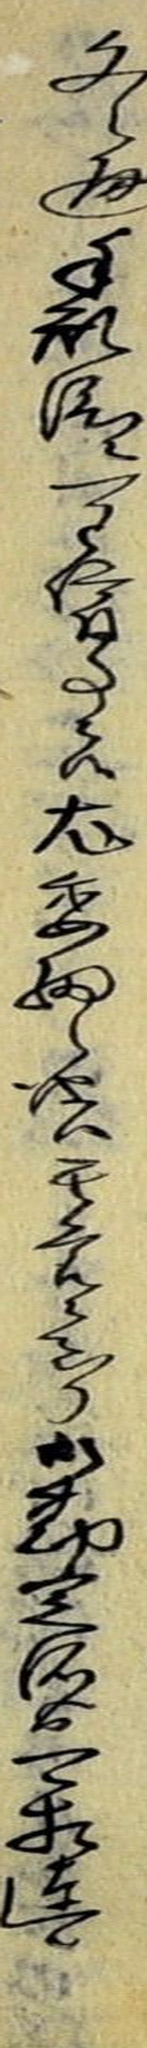文之通手形渡に可被仰付事に候尤委細之儀は其節に至り御勘定所ゟ可相達候
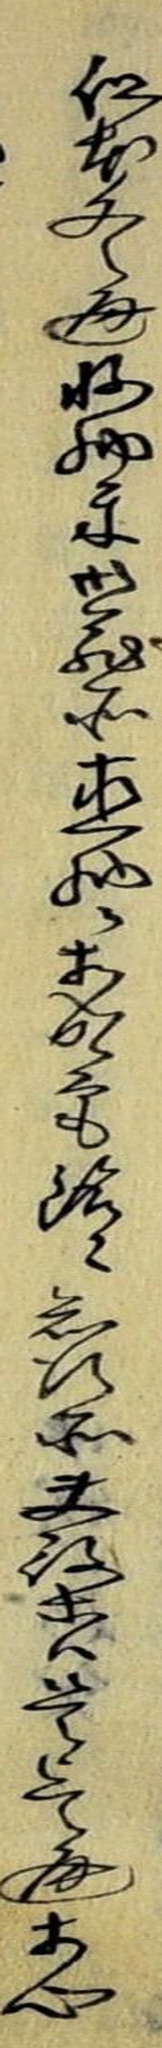但本文之通収納米御蔵所直納に相成候而も銘々知行諸夫役等は是迄之通相心
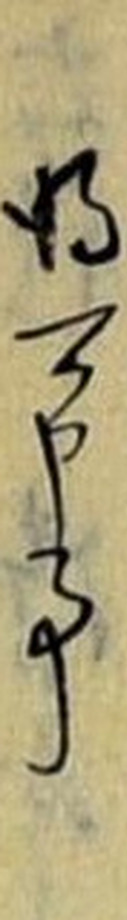得可申事
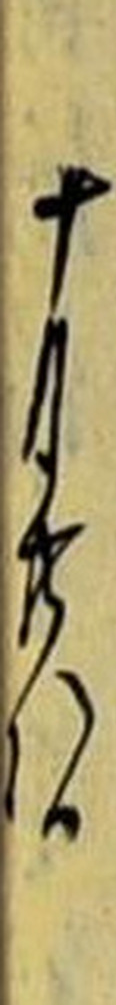十月十五日
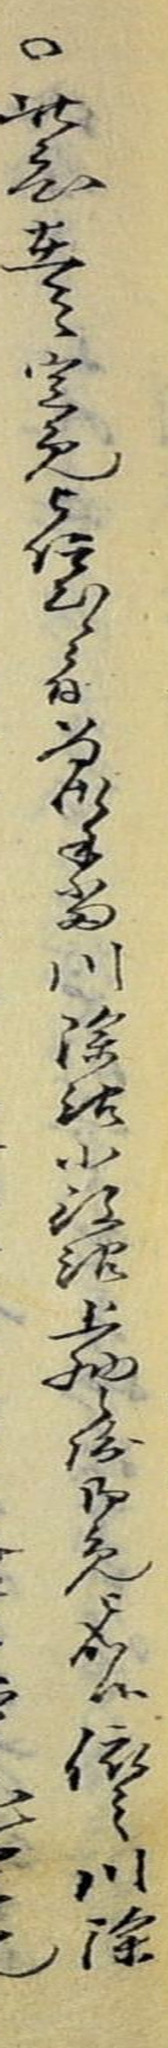○此度在々定免被仰出候に付為御手当川除銀小役銀上納之儀御免被成候依之川除
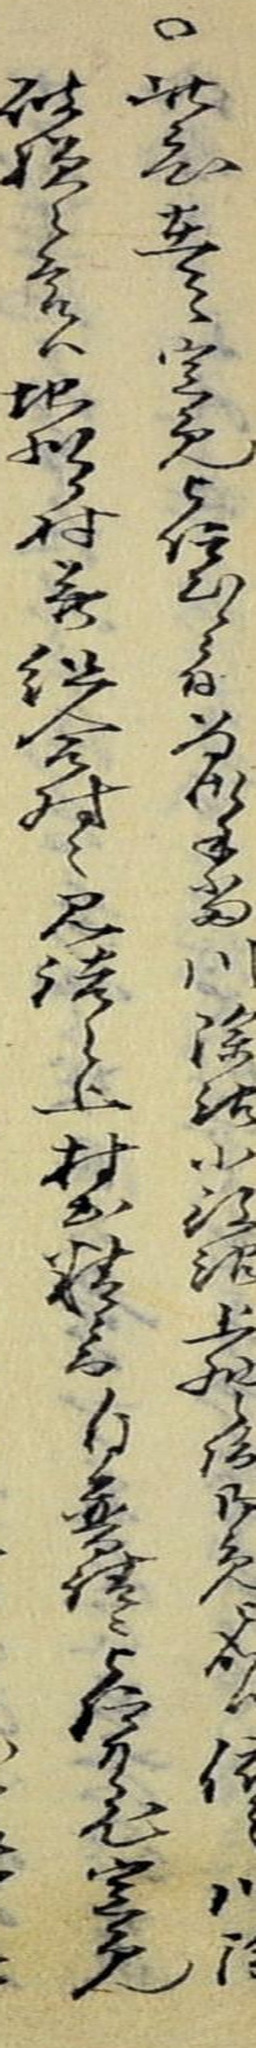破損之節は地掛り村并組合村之見詰之上村出精に而普請被仰付候尤定免
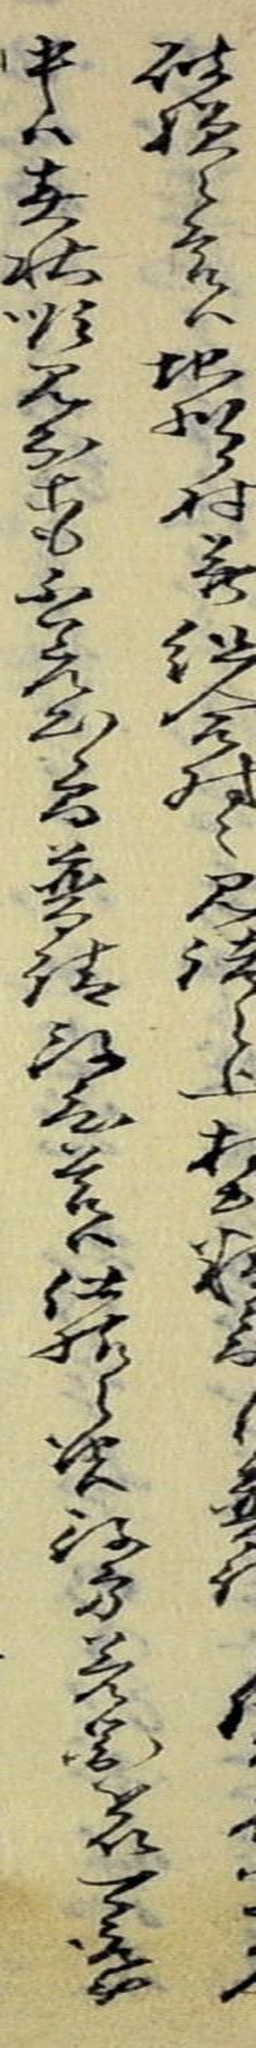中は春秋巡見分等も不差出候間普請致度節は仕様之儀は役方指図を以可取斗
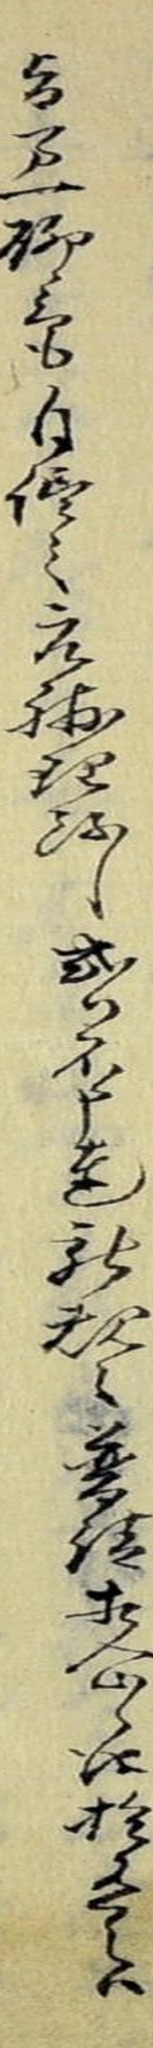旨万一聊に而も自儘之取捕理致し或は不申達新規之普請相企候儀於有之は
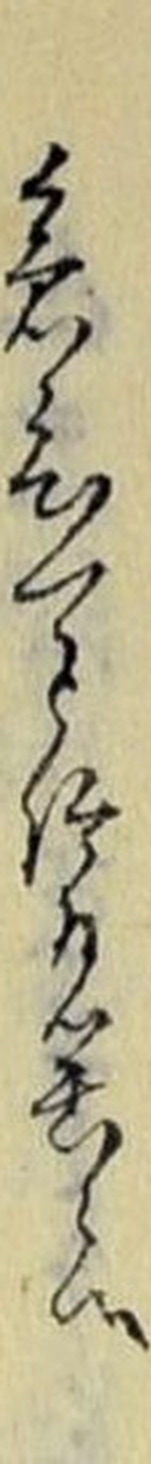急度可被仰付筈に候
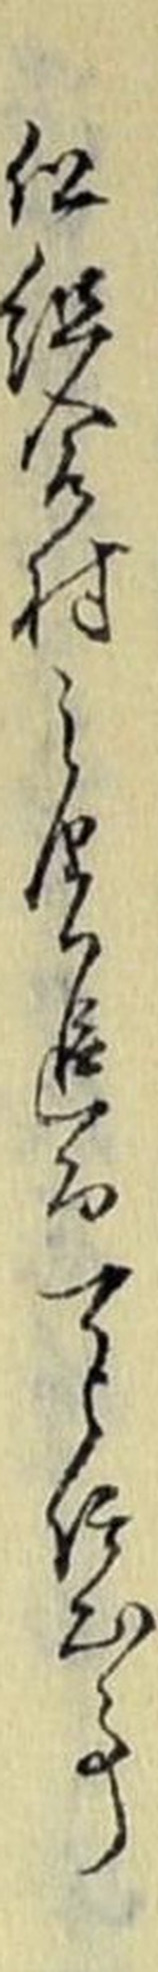但組合村之儀は追而可被仰出候事
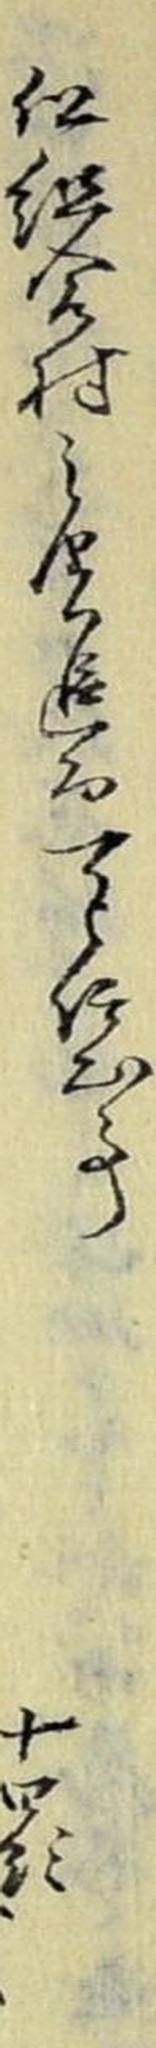但組合村之儀は追而可被仰出候事
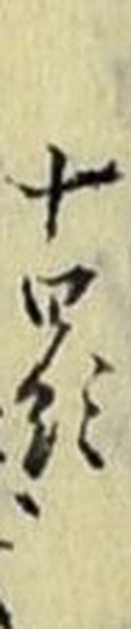十四領
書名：命令之部 六
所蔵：福井県文書館 Fukui Prefectural Archives
